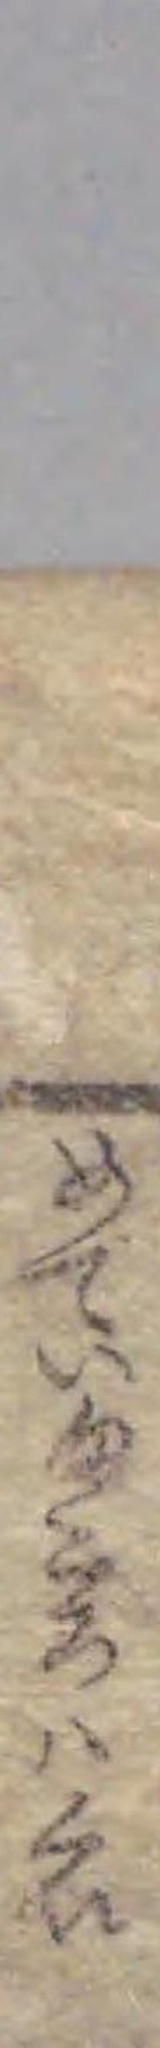めていまころはくい
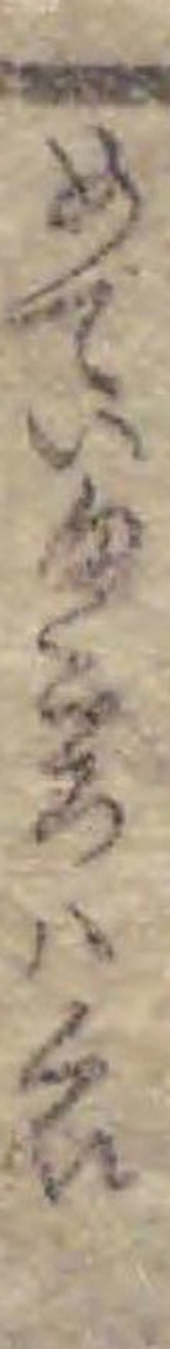めていまころはくい
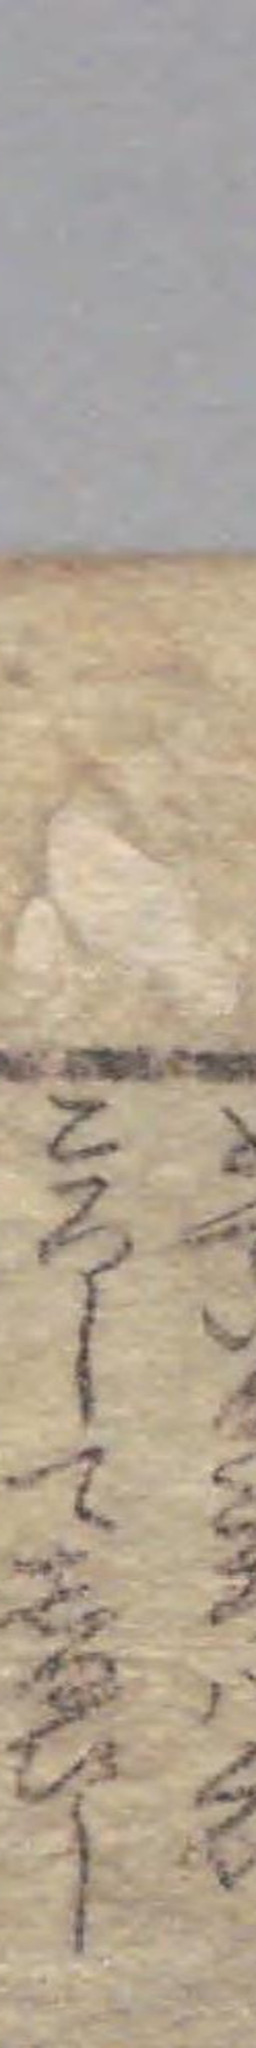ころしてしまひし
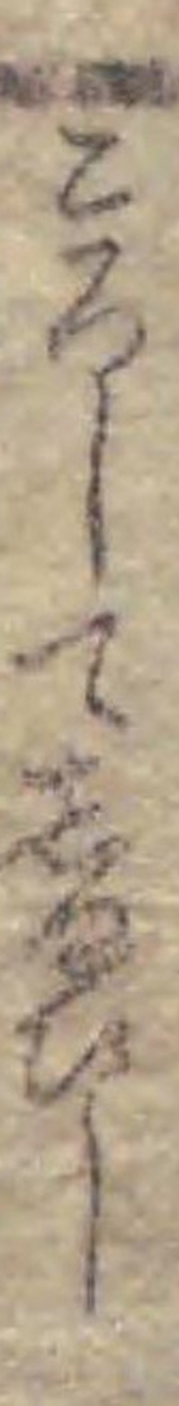ころしてしまひし
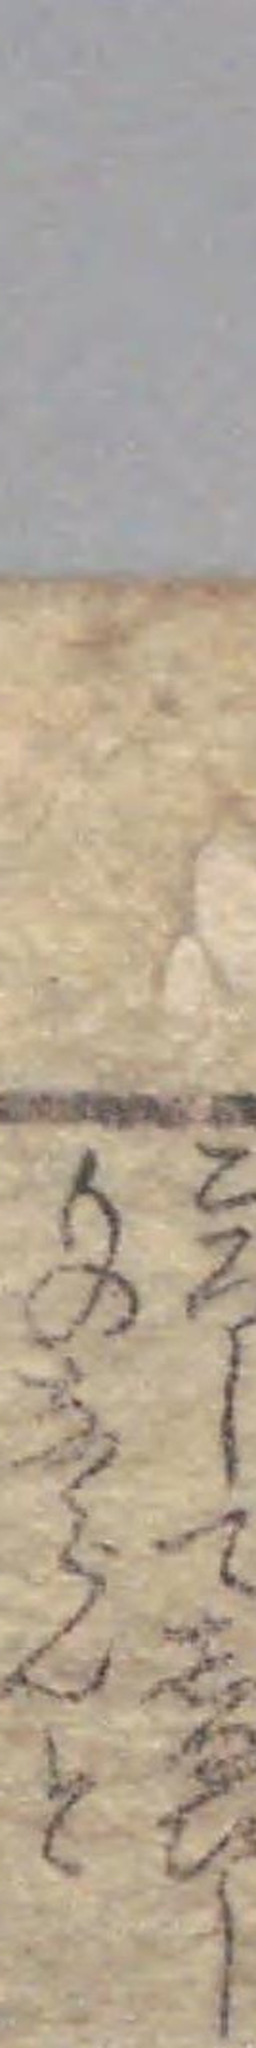ものならんと
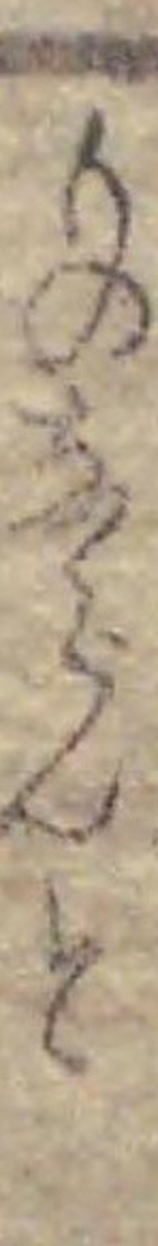ものならんと
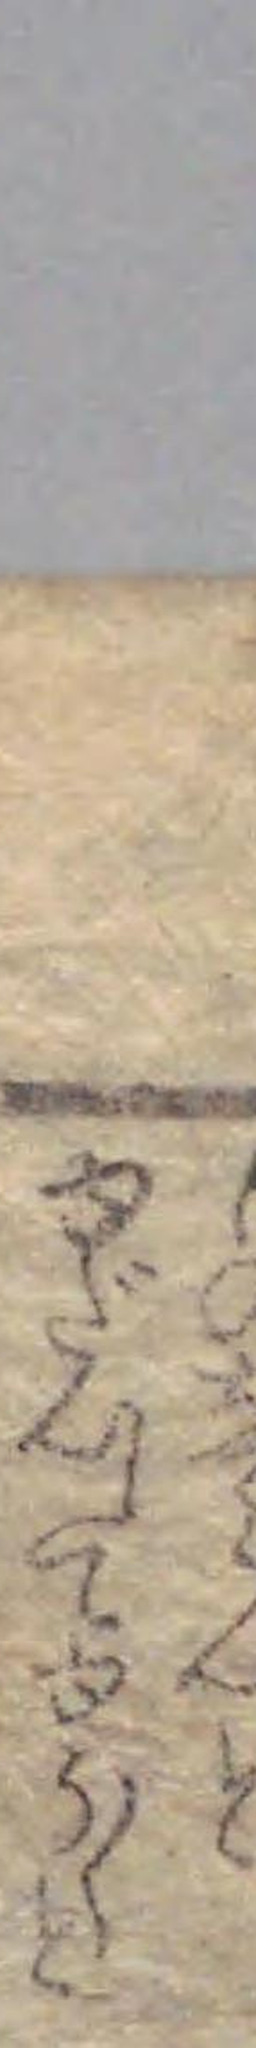ゆだんしてゆう〳〵と
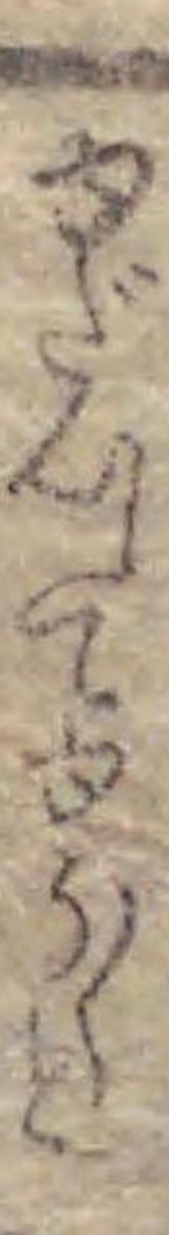ゆだんしてゆう〳〵と
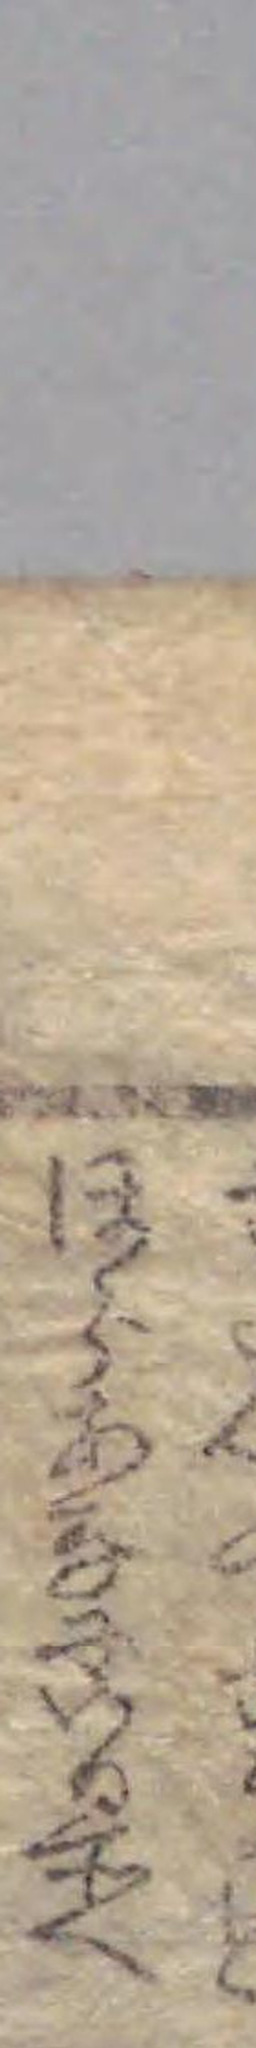ほらあなにいる所へ
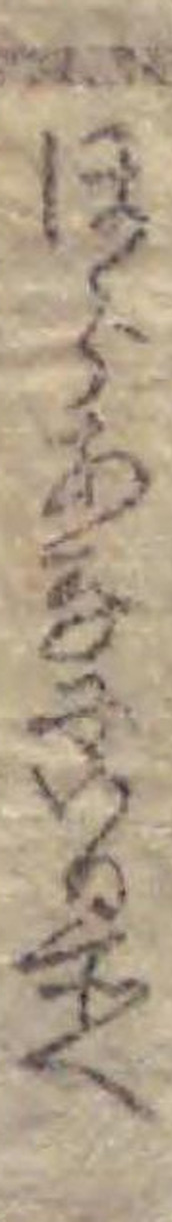ほらあなにいる所へ
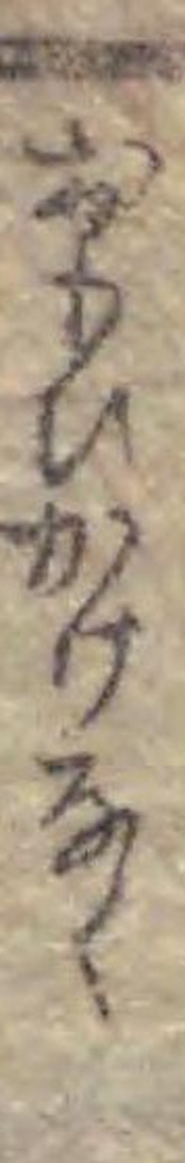おもひかけなく
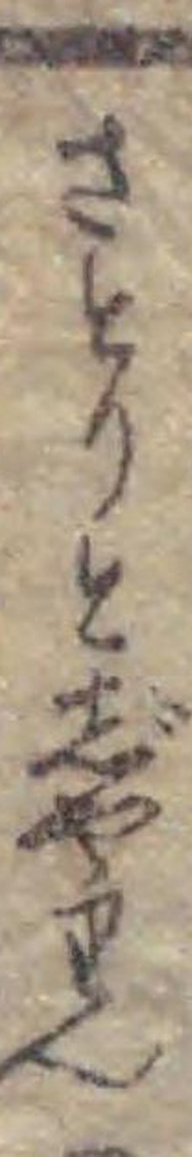さとりとじやりん
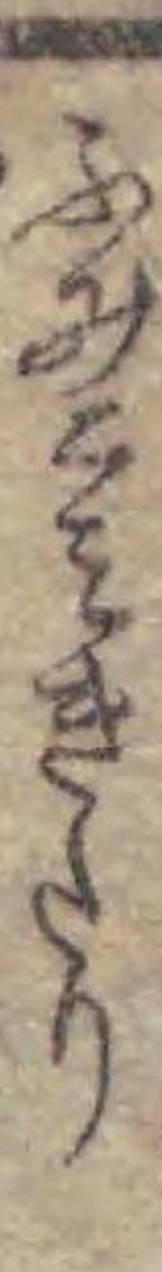ふみこみきたり
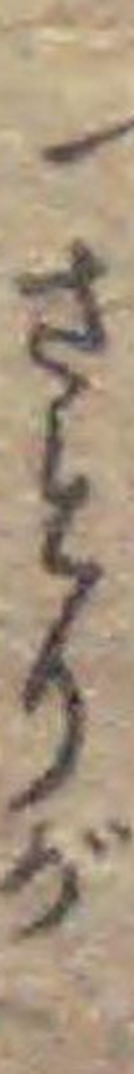さとりが
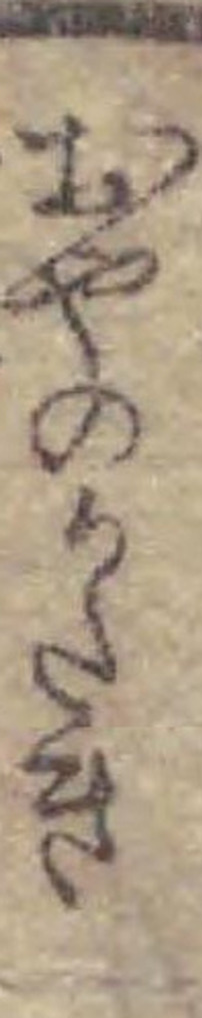おやのかたき
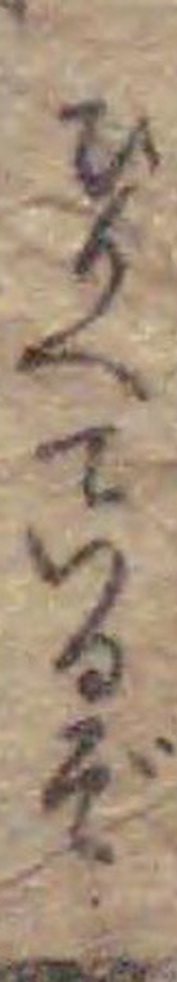ひかへているぞ
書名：化物世界夜半嵐 : 3巻
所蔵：国立国会図書館 National Diet Library, JAPAN
